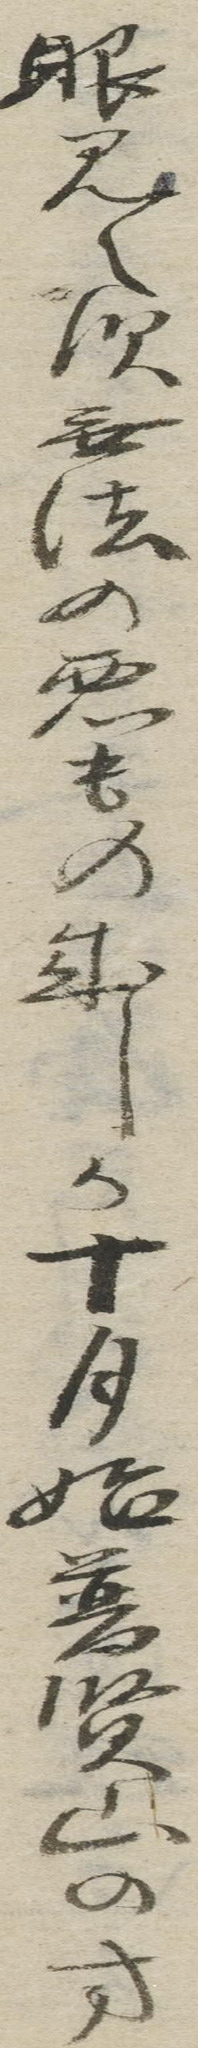眼見えす無法の悪もの成しか十月始普賢山の方
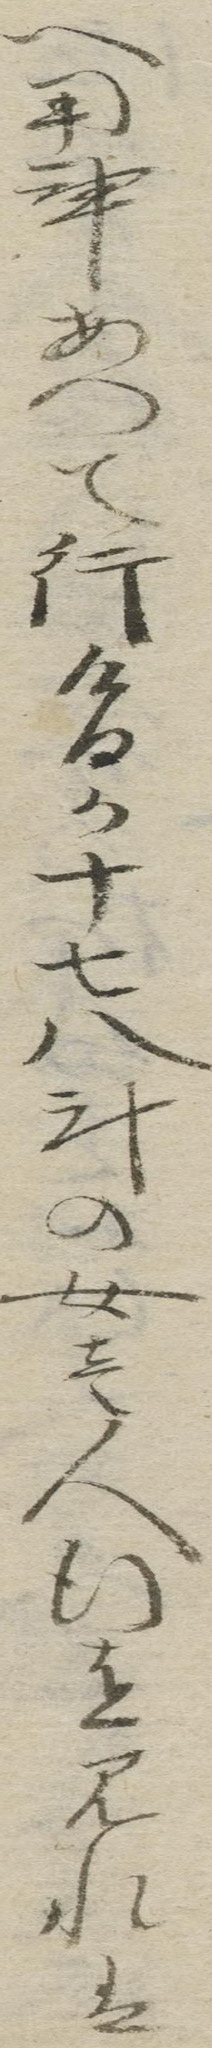へ用事あつて行けるか十七八計の女壱人行を見れは
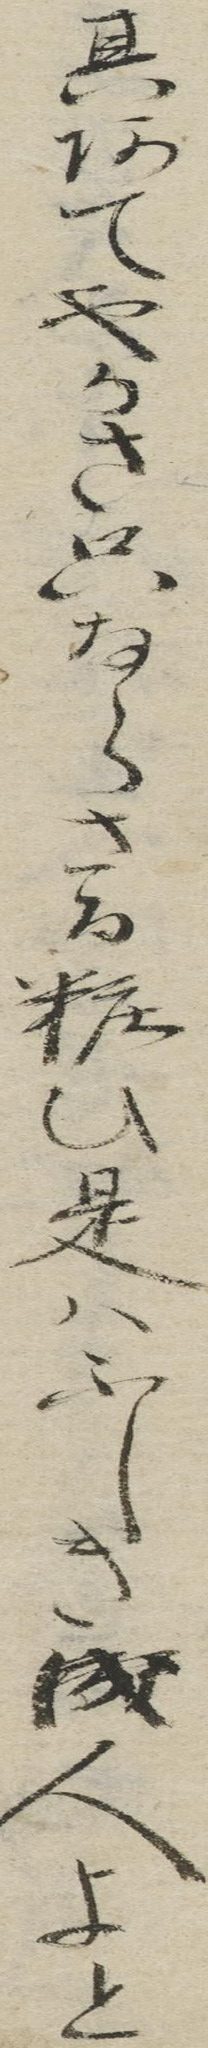其あてやかさ只ならさる粧ひ是ハふしき成人よと
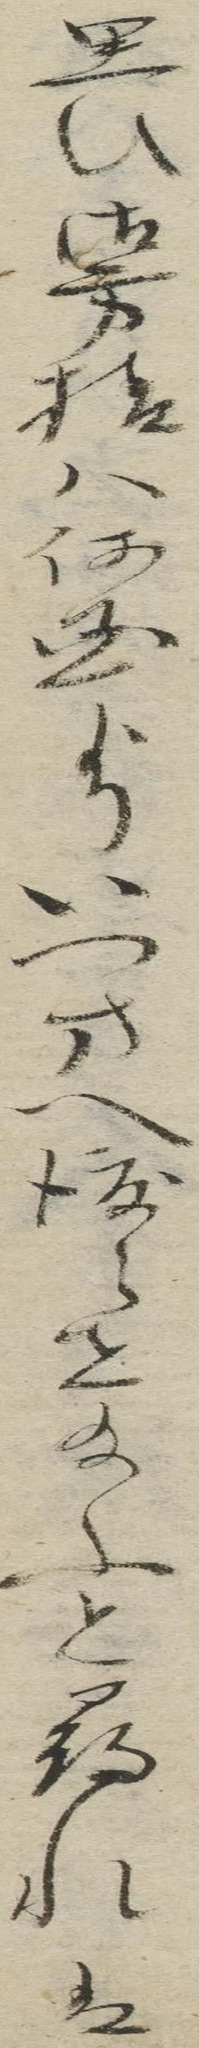思ひ御方様ハ何国よりいつ方へ渡らせ給ふと尋れは

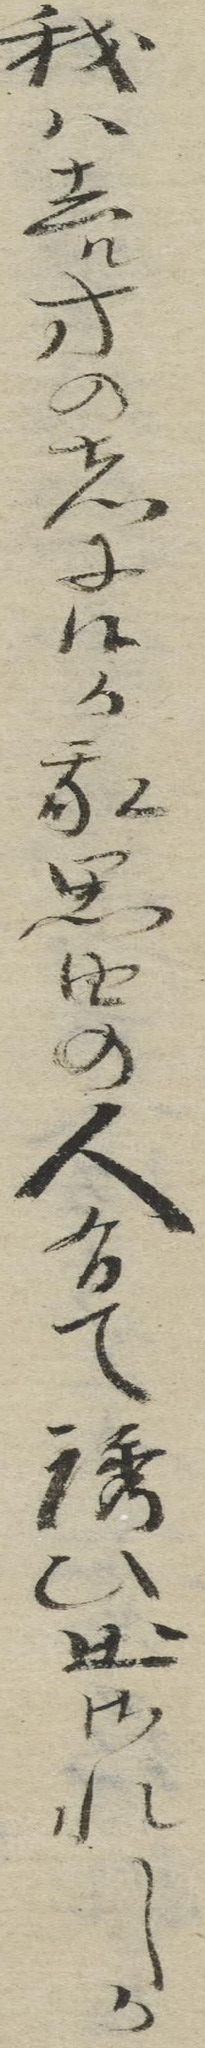我ハ去ル方の者に候か我思由の人有て誘ひ出されしか
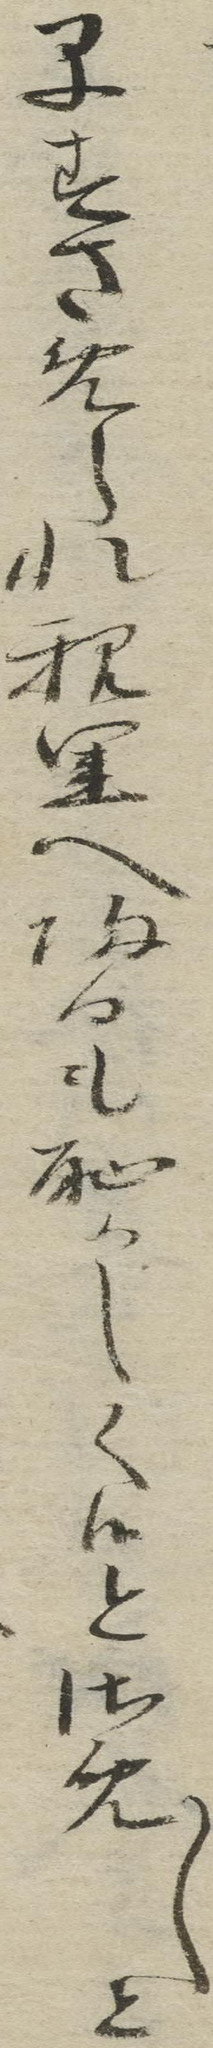早すさられ親里へ帰るも恥かしく候とさめ〳〵と
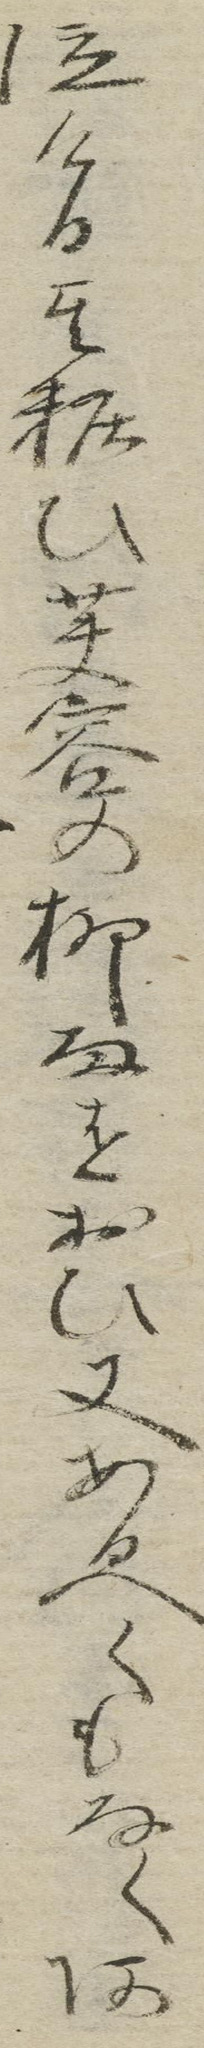泣きける其粧ひ芙蓉の柳面をおひ又あるへくもなくあ
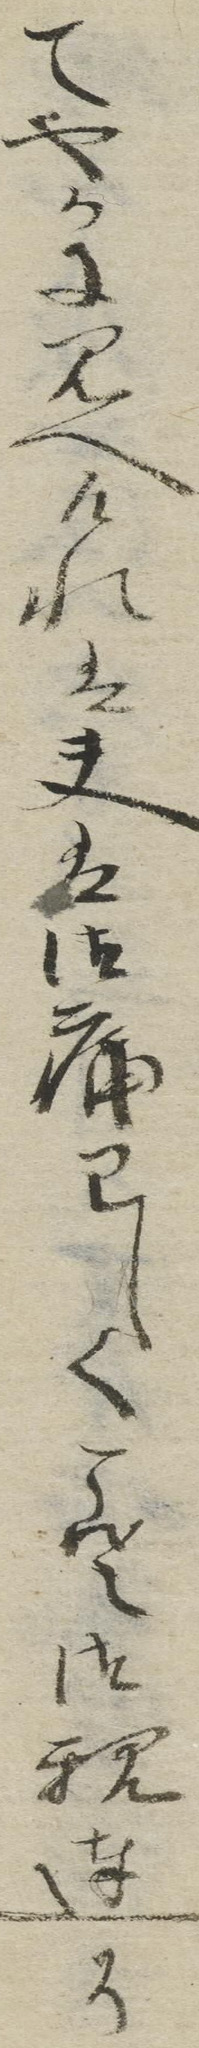てやかに見へけれは夫は御痛わしくこそ御親達に
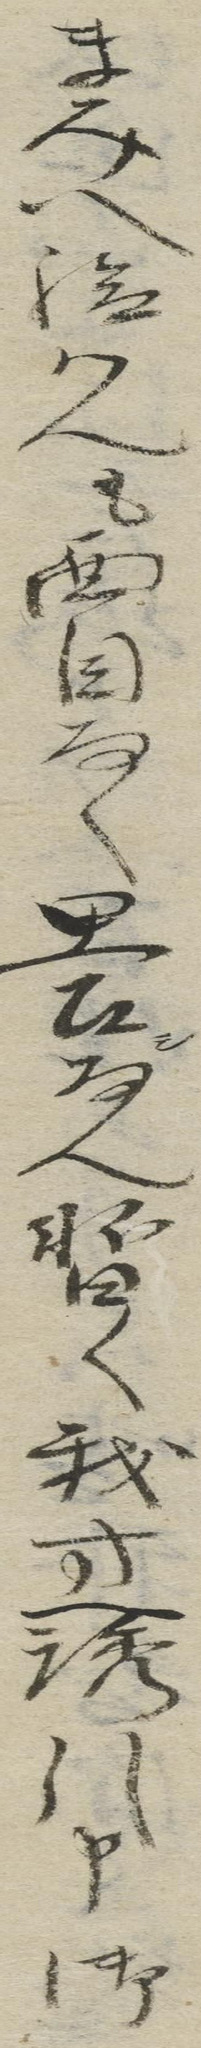まみへ給ハんも面目なく思召シなん暫く我方へ誘引申御
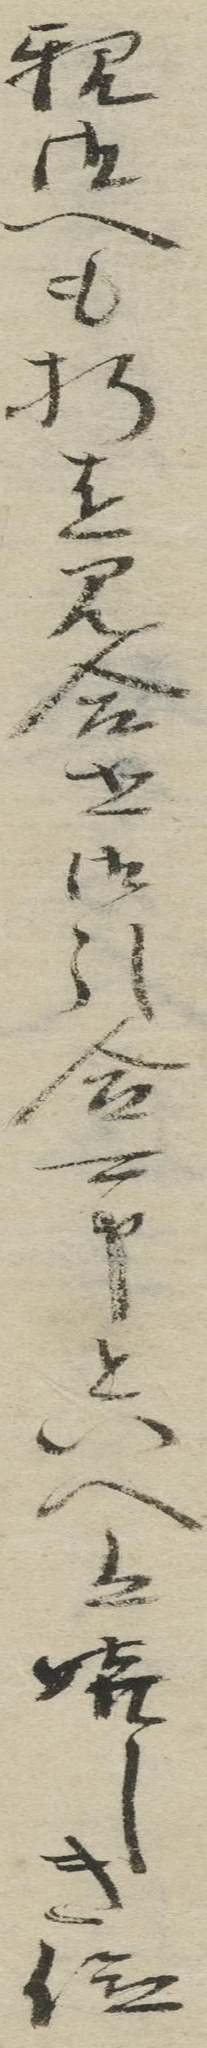親御へも折を見合せ御引合可申といへは嬉しき仰
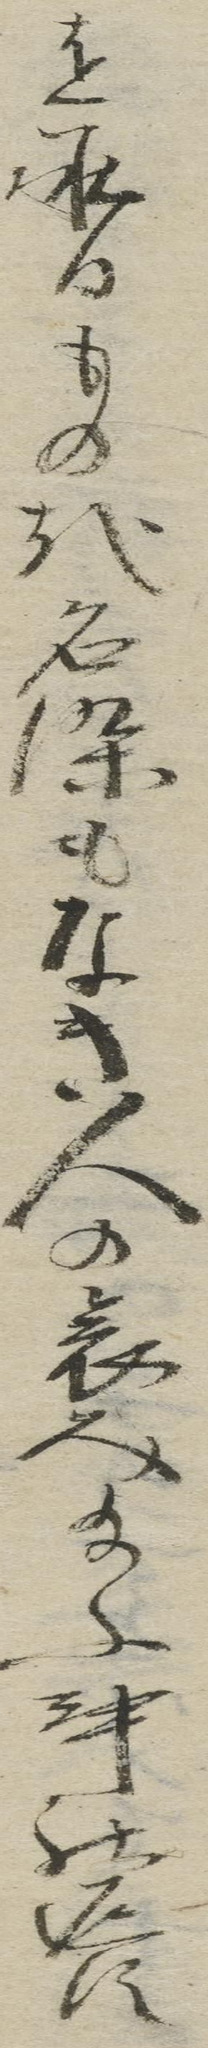を承るもの哉名染もなき人の哀み給ふ事の返す
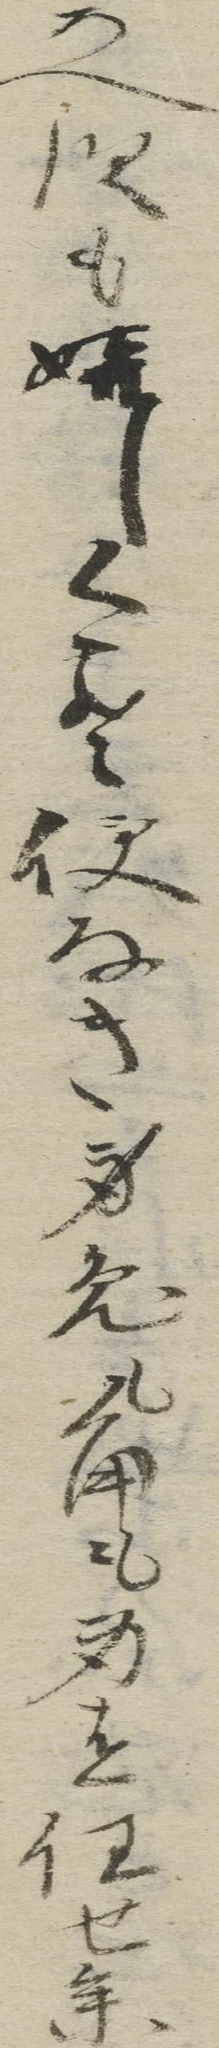かへすも嬉しくこそ便なき身兎も角も身を任せ参
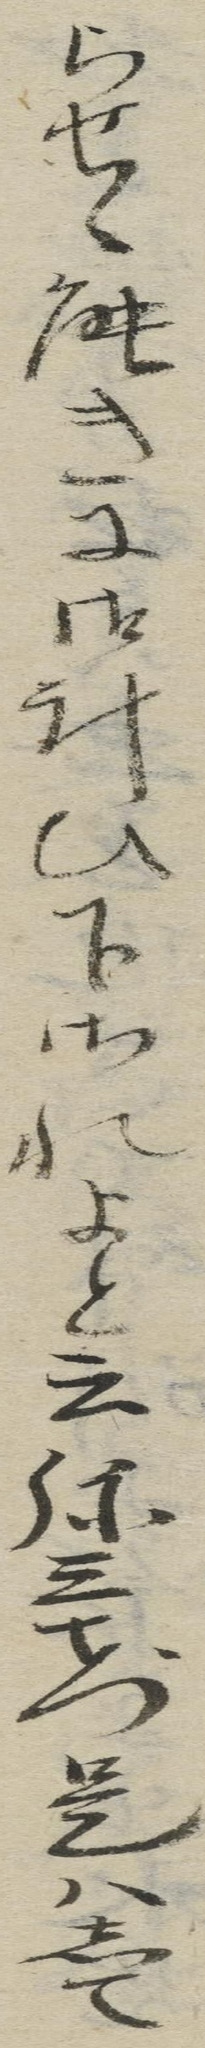らせ候能きに御計ひ下されよと云弥三右衛門是ハして
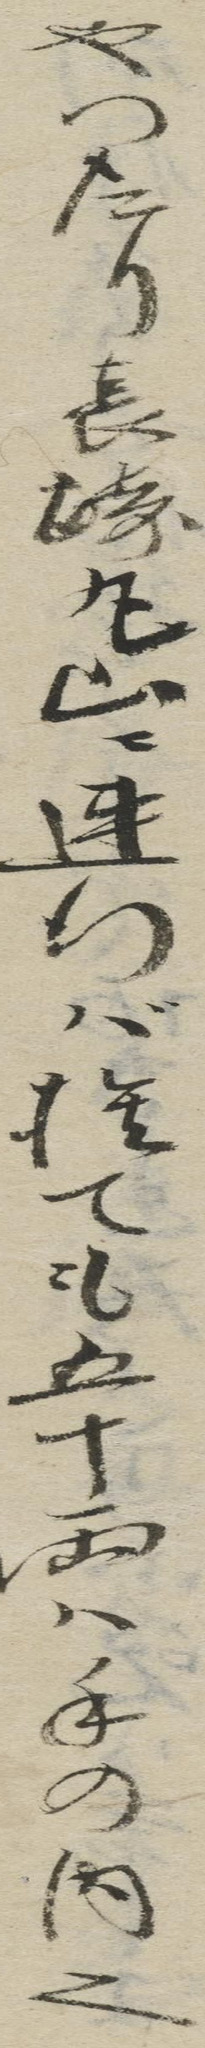やつたり長﨑丸山ニ連行バ捨ても五十両ハ手の内也
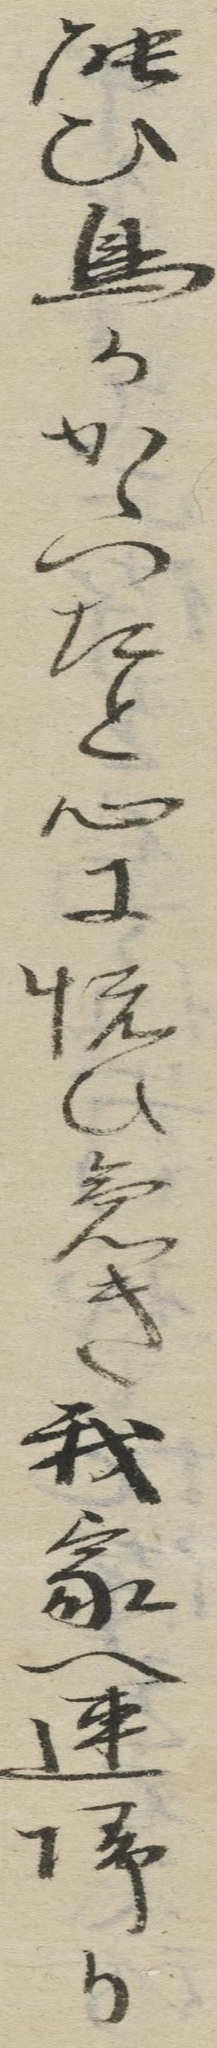能ひ鳥かかゝつたと心に悦ひ急き我家へ連帰り
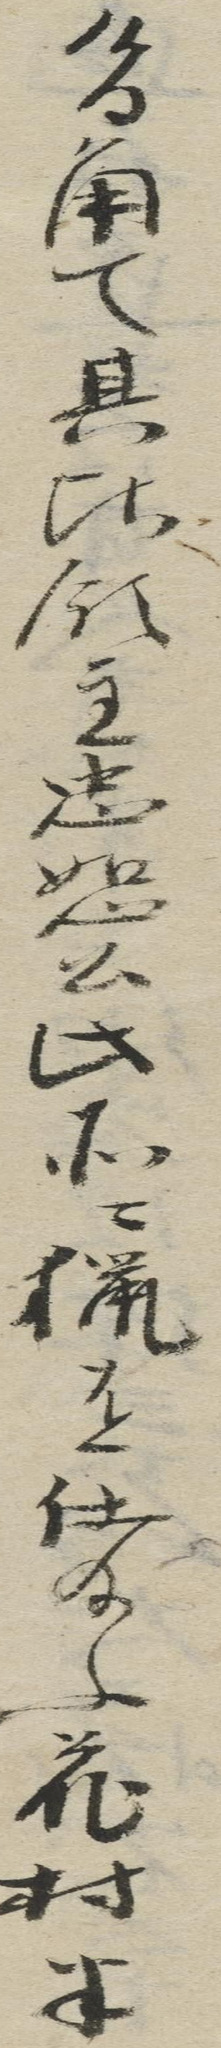ける角て其比領主忠恕公此所ニ猟を仕給ふ花村半
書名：肥前國島原領普賢山大変記　完
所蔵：東京大学地震研究所図書室 Earthquake Research Institute Library, The University of Tokyo, JAPAN
